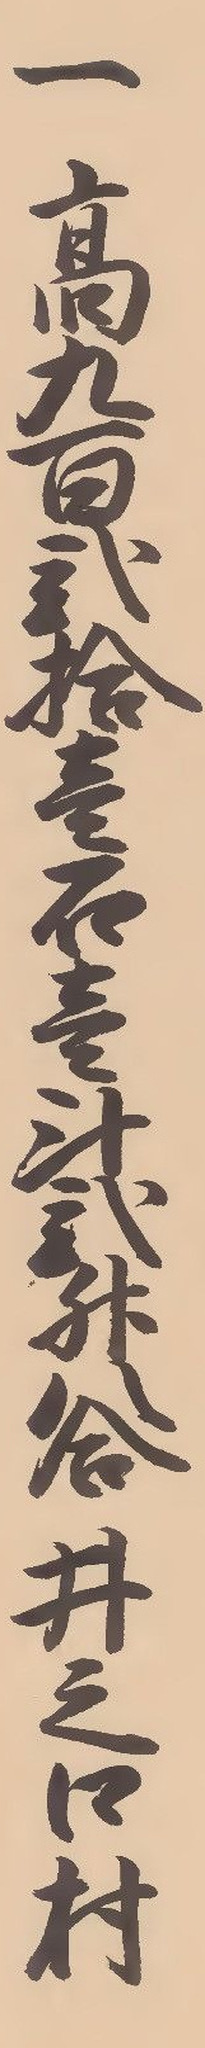一高九百弐拾壱石壱斗弐升八合井之口村
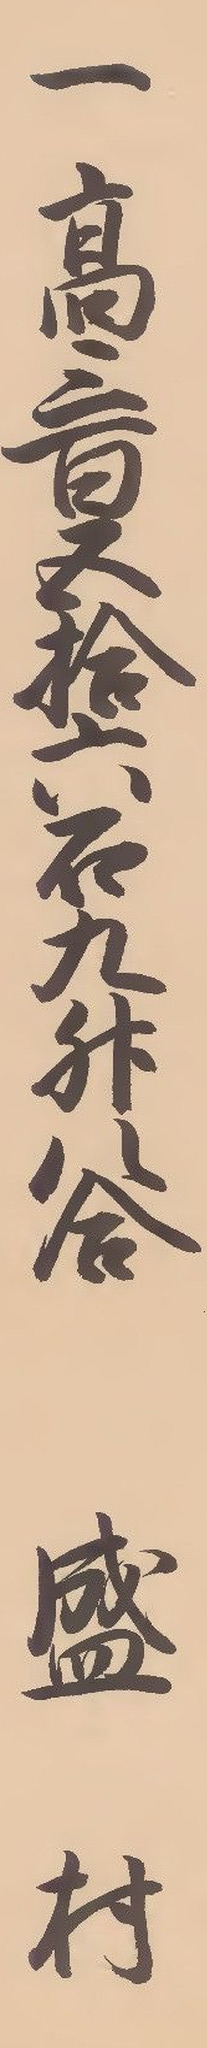一高三百五拾六石九升八合盛村
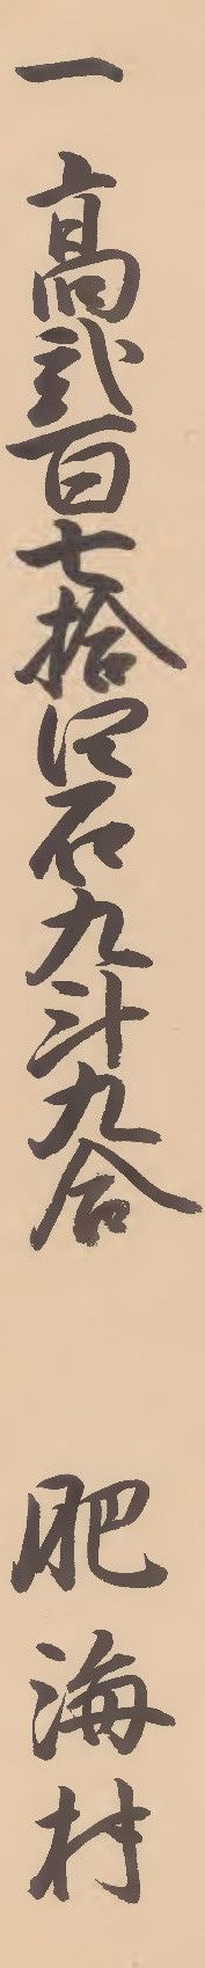一高弐百七拾四石九斗九合肥海村

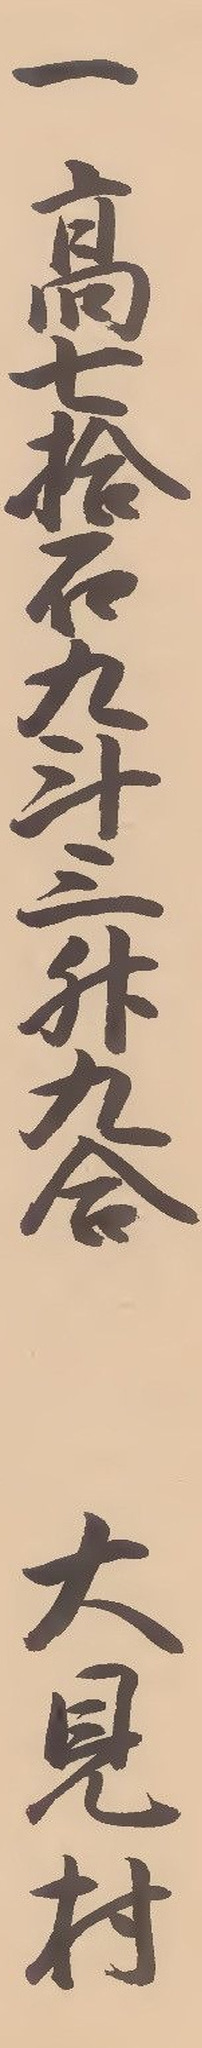一高七拾石九斗三升九合大見村
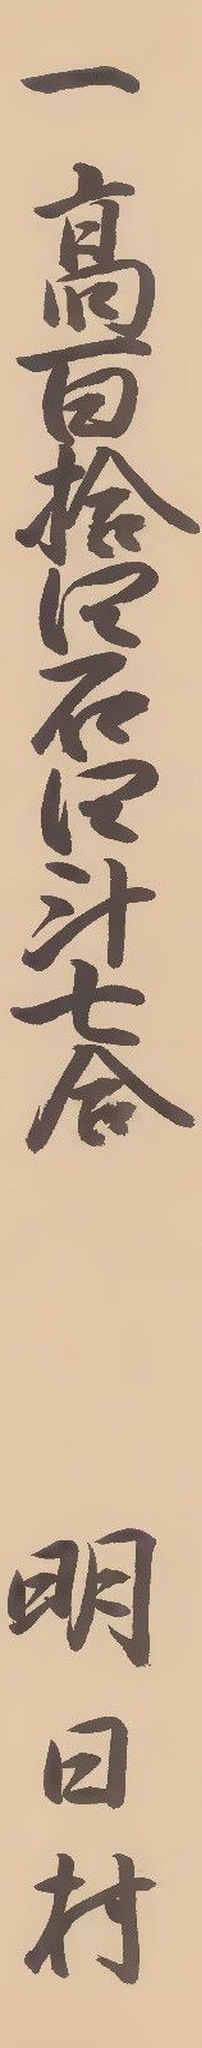一高百拾四石四斗七合明日村
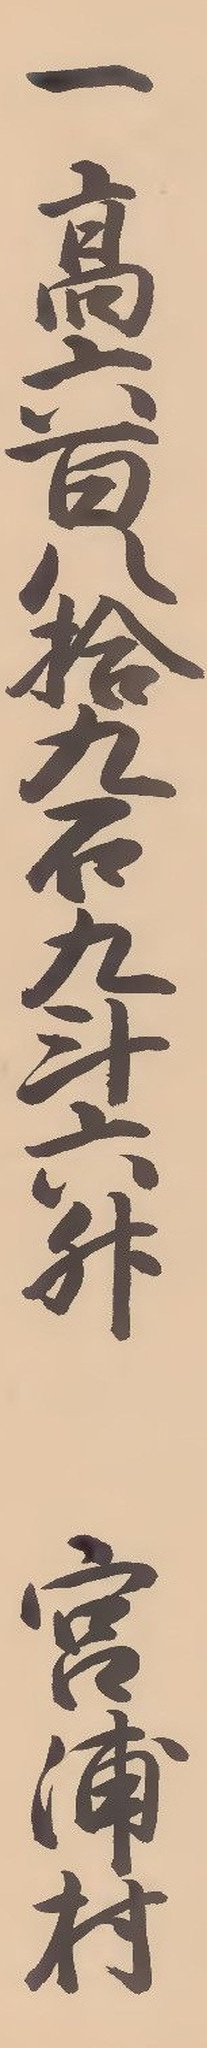一高六百八拾九石九斗六升宮浦村
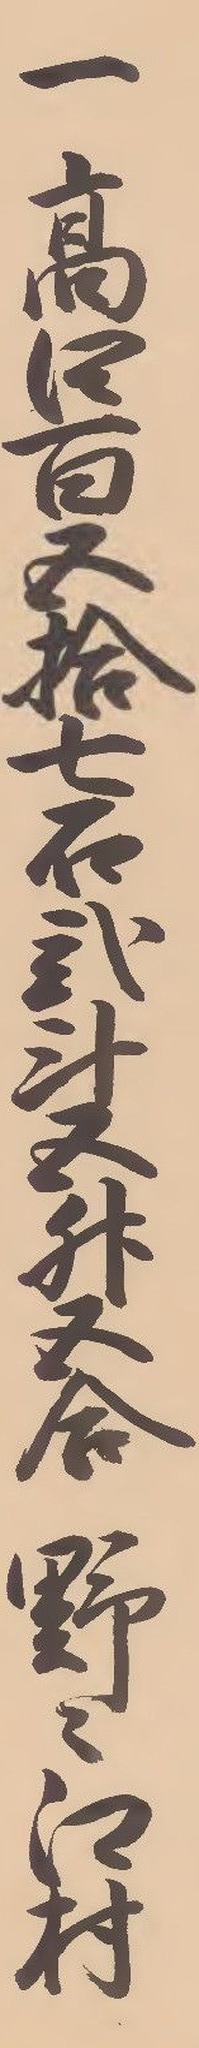一高四百五拾七石弐斗五升五合野々江村
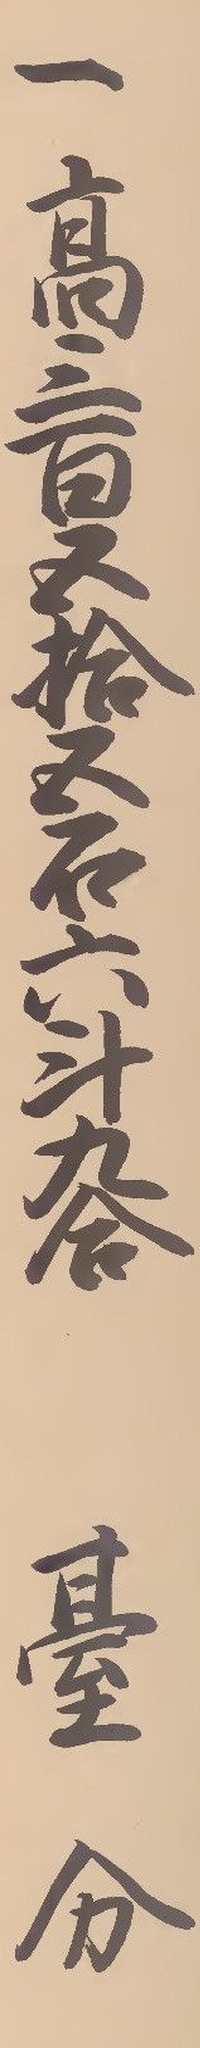一高三百五拾五石六斗九合台分
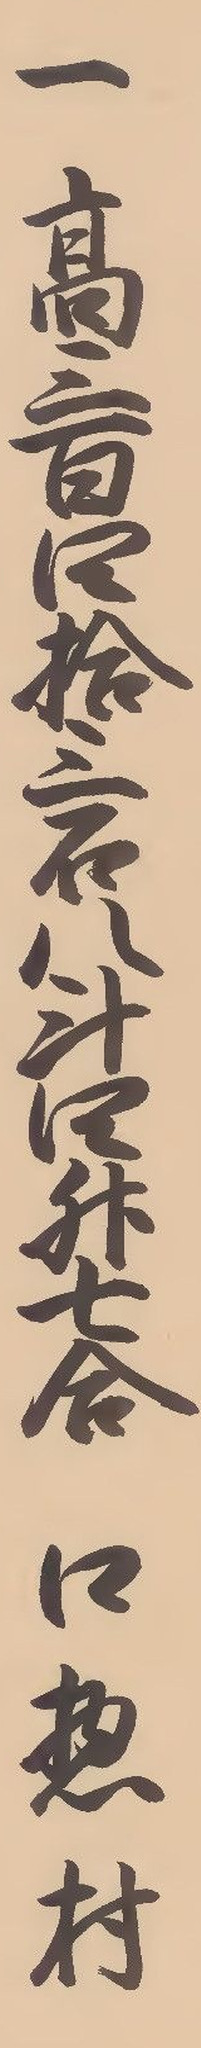一高三百四拾三石八斗四升七合口惣村
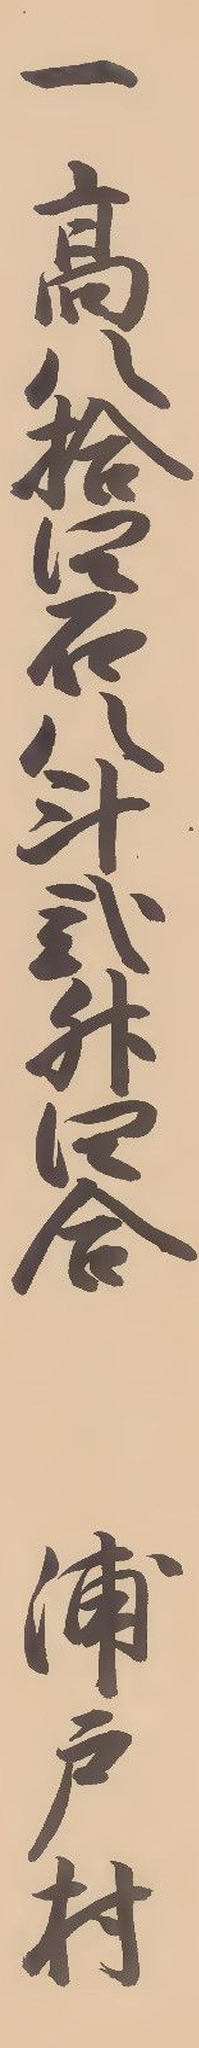一高八拾四石八斗弐升四合浦戸村
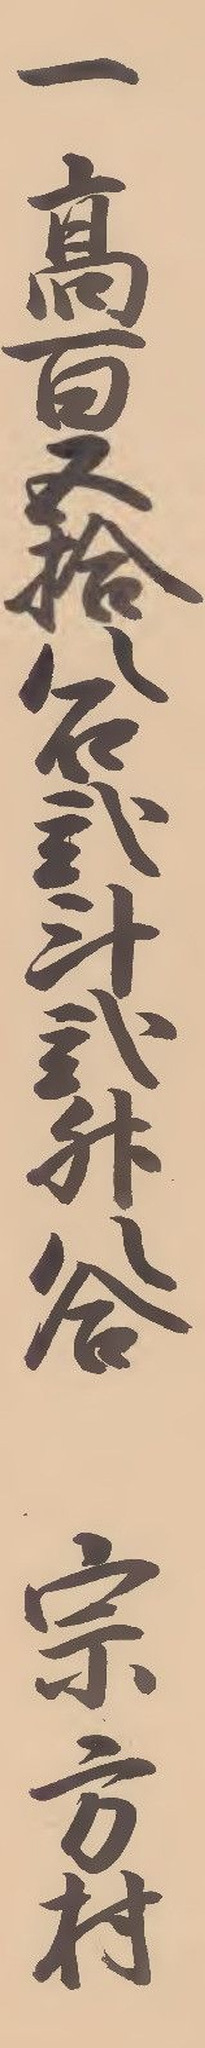一高百五拾八石弐斗弐升八合宗方村

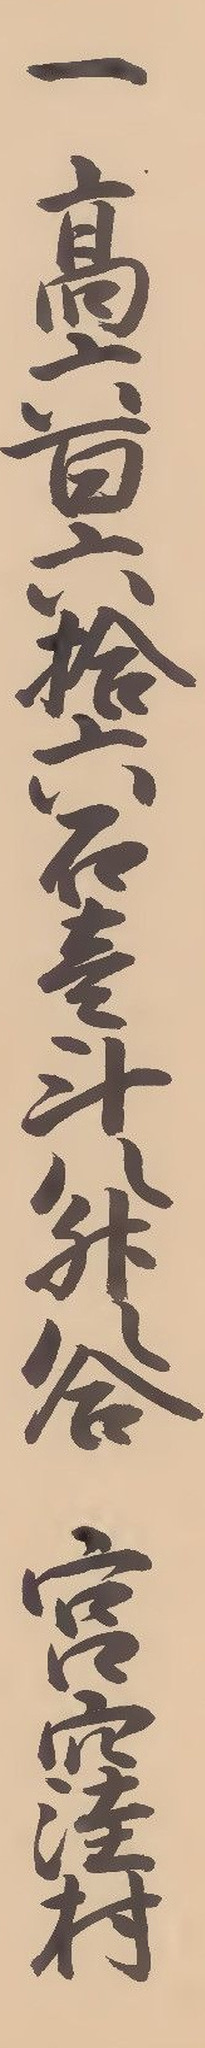一高六百六拾六石壱斗八升八合宮窪村
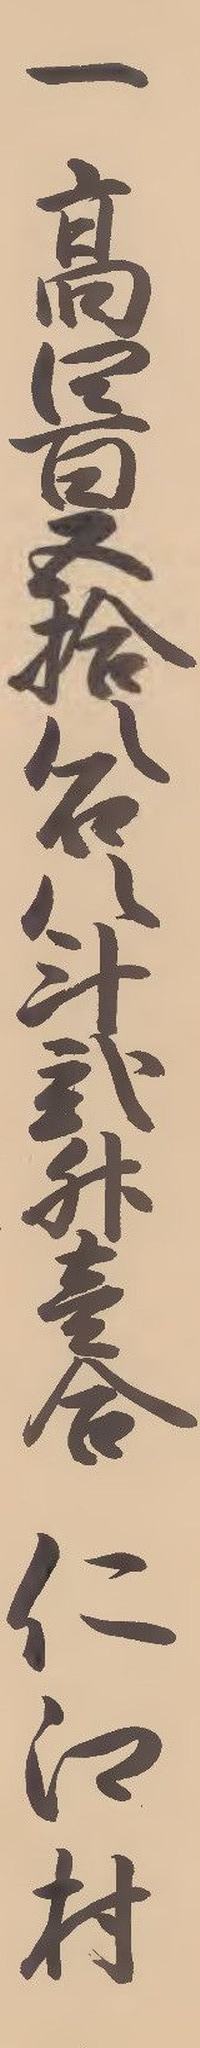一高四百五拾八石八斗弐升壱合仁江村
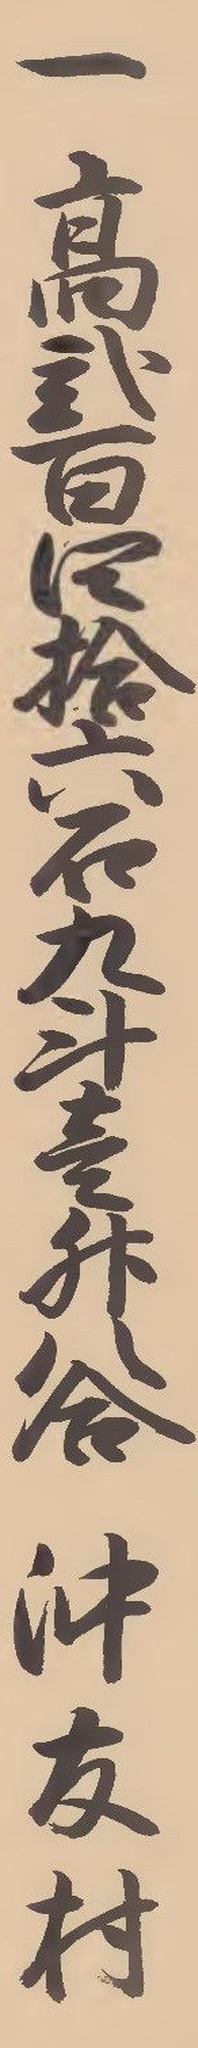一高弐百四拾六石九斗壱升八合沖友村
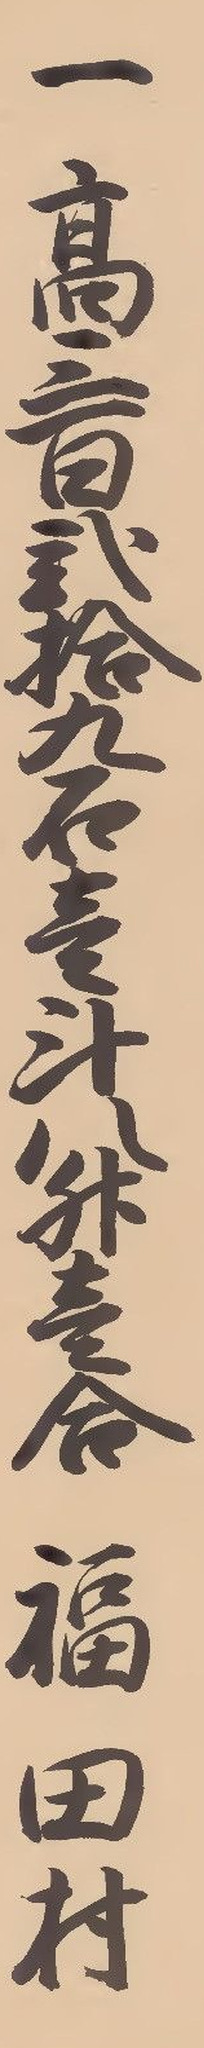一高三百弐拾九石壱斗八升壱合福田村
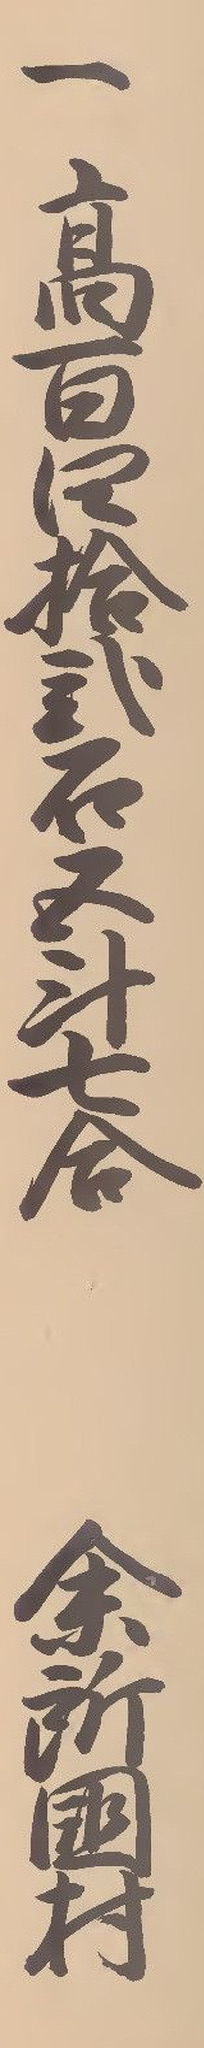一高百四拾弐石五斗七合余所国村
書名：伊予国郷帳
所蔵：国立公文書館 National Archives of Japan
